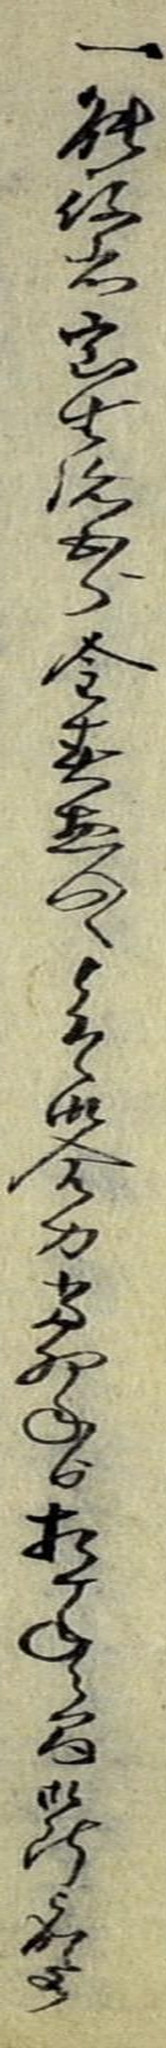一能役者宝生弥五郎金春惣右衛門へ被下候御合力当卯年ゟ拾ヶ年之間御断被成候事
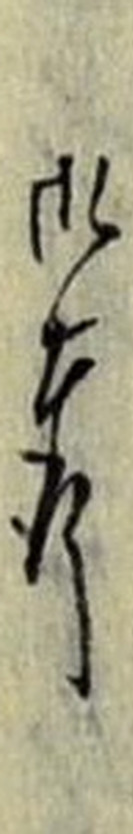御奉行
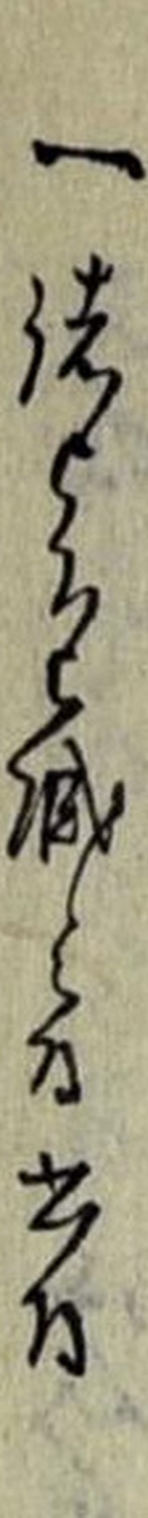一諸被下被減候に付書付
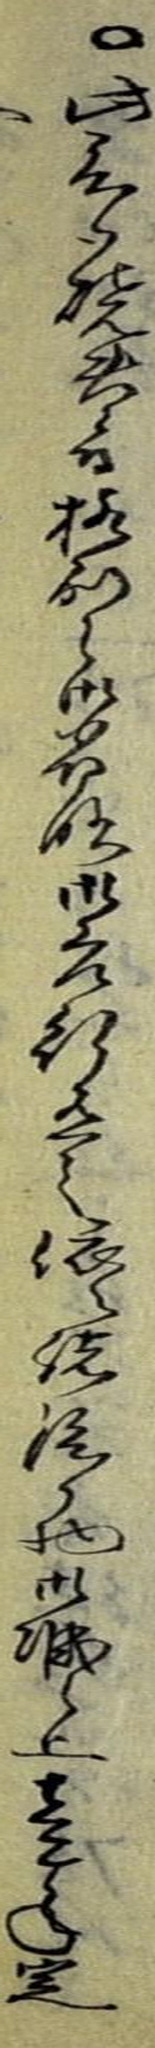○此度御焼失に付格別之御省略御取行有之依之諸渡り物御減之上壱年定
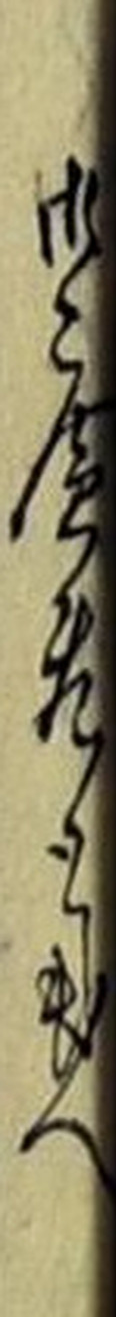御広敷御用人
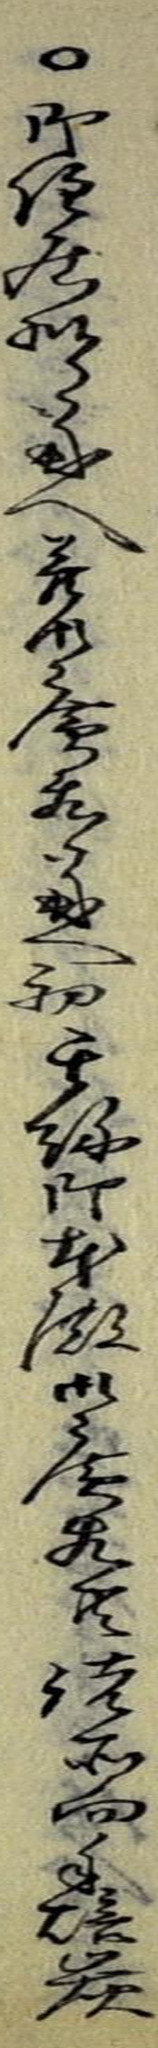○御住居掛り御用人并御広敷御用人初其餘御本殿御広敷共詰所向手焙炭
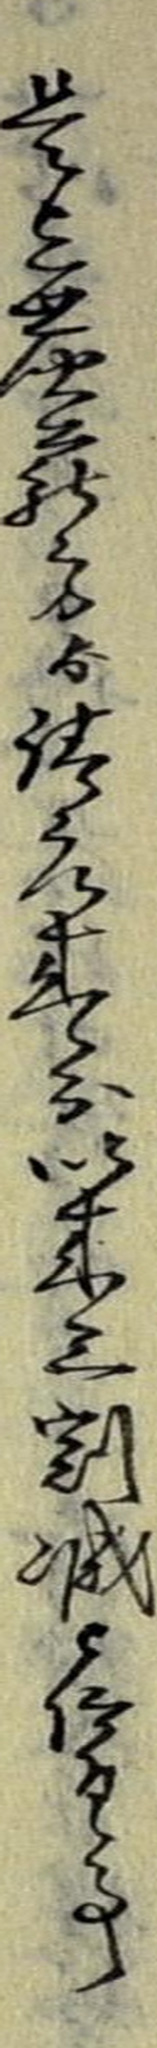是迄炭薪方ゟ請取来候分以來三割減被仰付候事
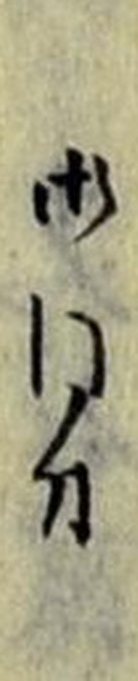御目付
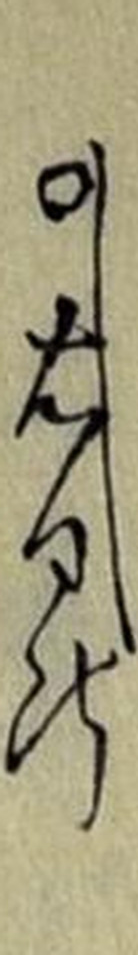○右同断
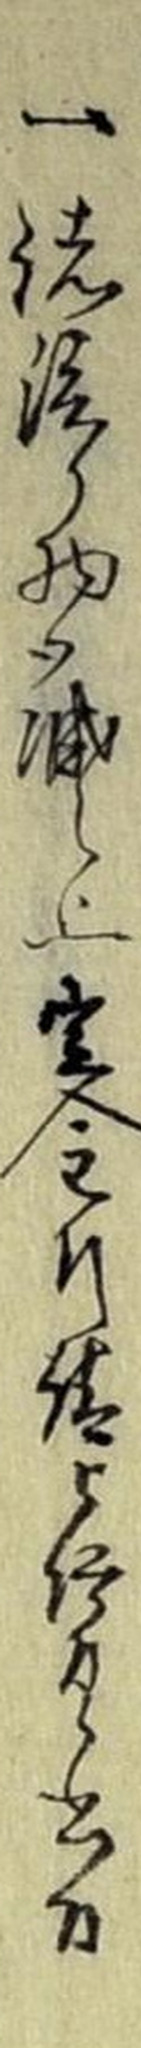一諸渡り物御減之上定金引請被仰付候書付
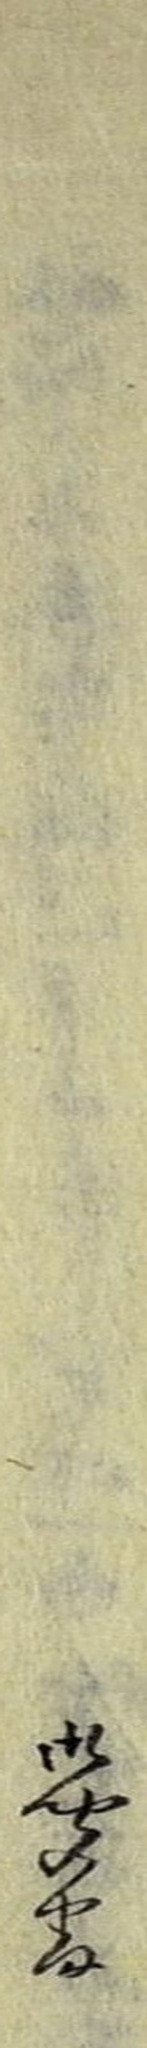御聞番
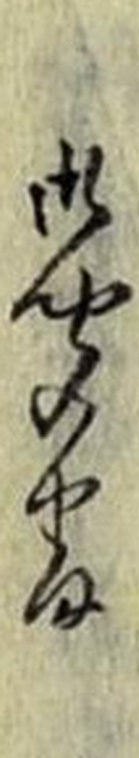御聞番
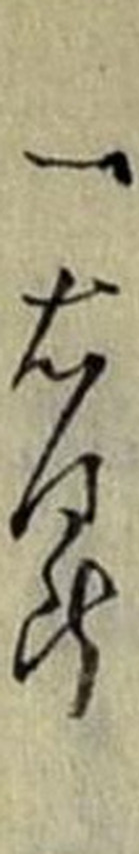一右同断
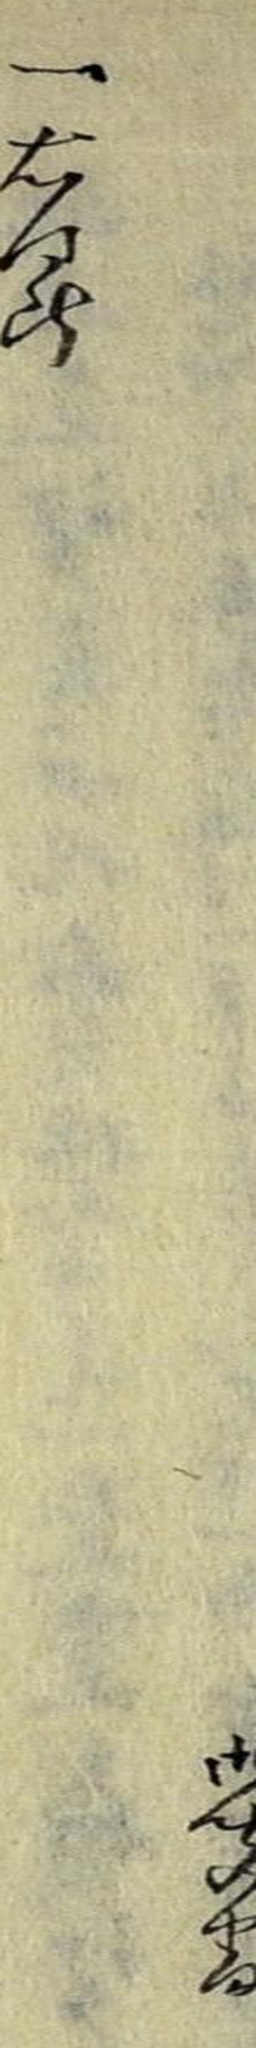一右同断
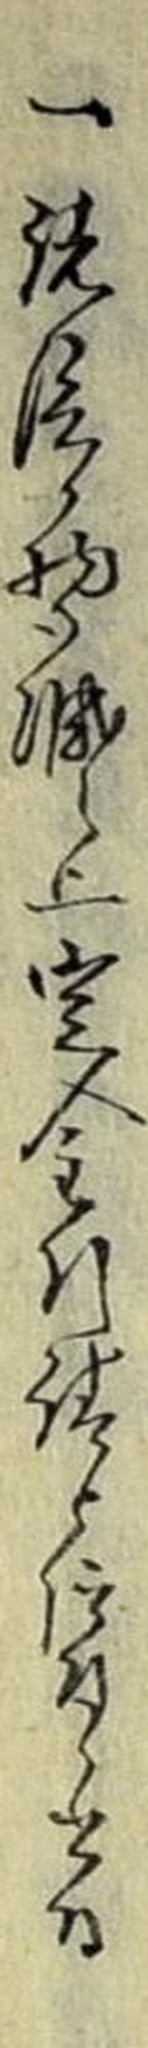一諸渡り物御減之上定金引請被仰付候書付
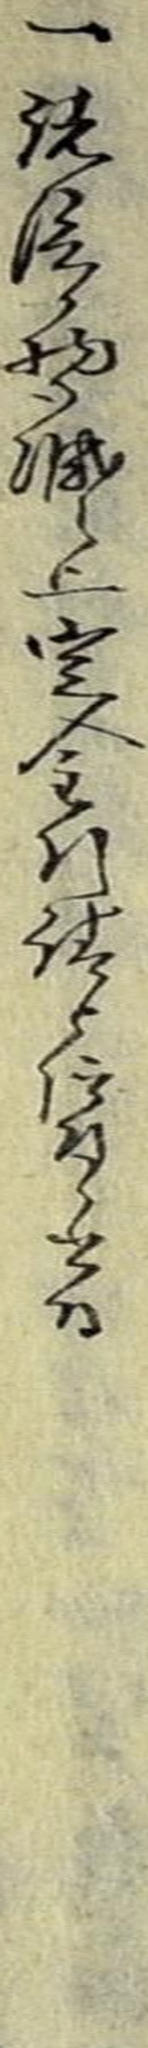一諸渡り物御減之上定金引請被仰付候書付
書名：命令之部 六
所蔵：福井県文書館 Fukui Prefectural Archives
